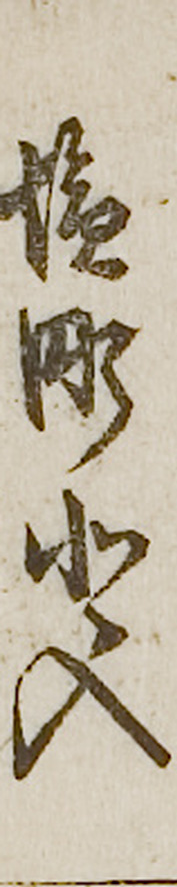塩町北へ入
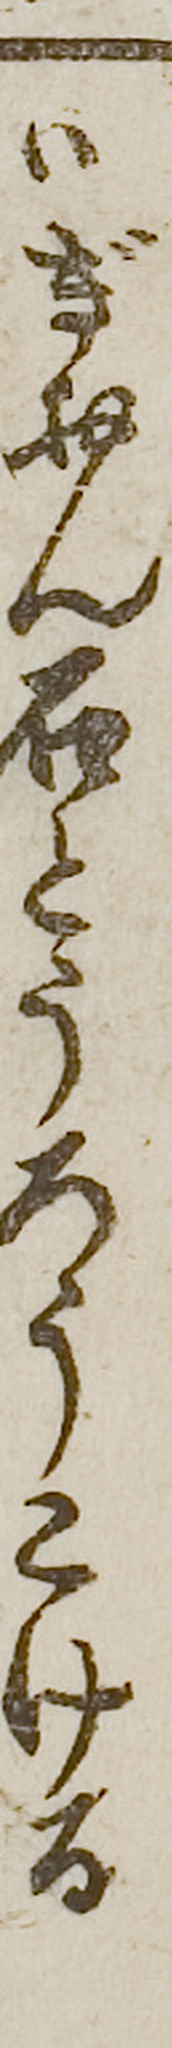〃ぎおん石とうろうこける
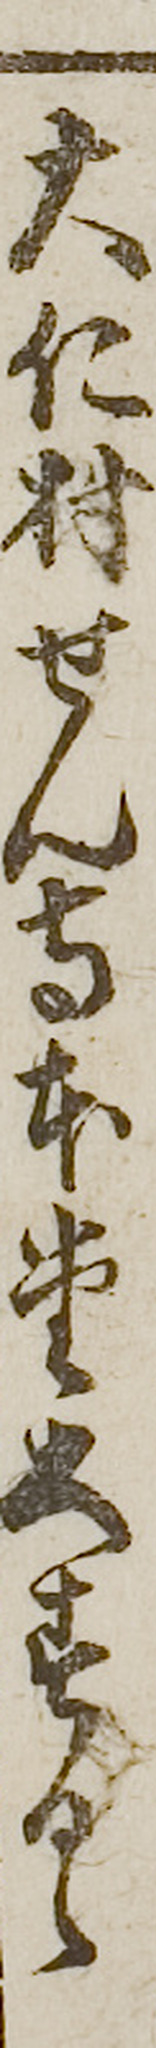大仁村せん寺本堂くするゝ
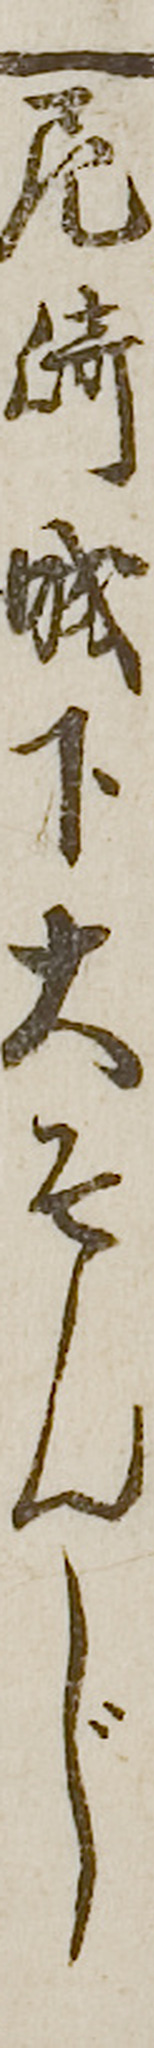尼崎城下大そんじ
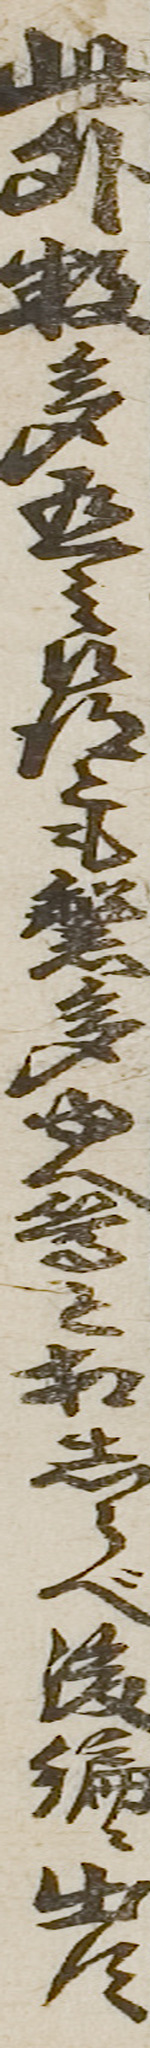此外数多有之候得とも繁多ゆへ篤と相しらべ後編に出す
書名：摂津大ぢしん
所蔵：東京大学総合図書館 General Library in the University of Tokyo, JAPAN
